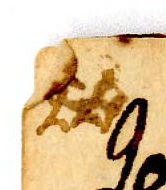24
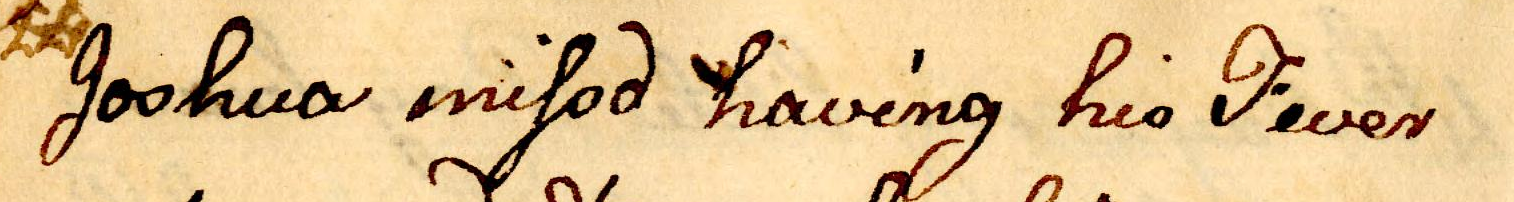Joshua missd having his Fever
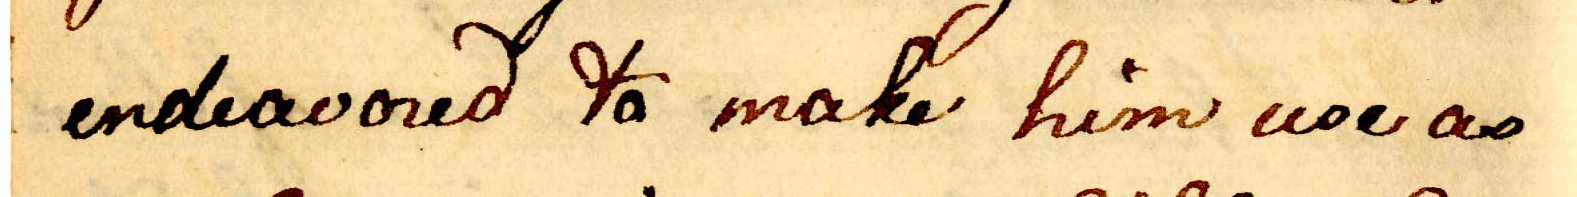endeavored to make him use as
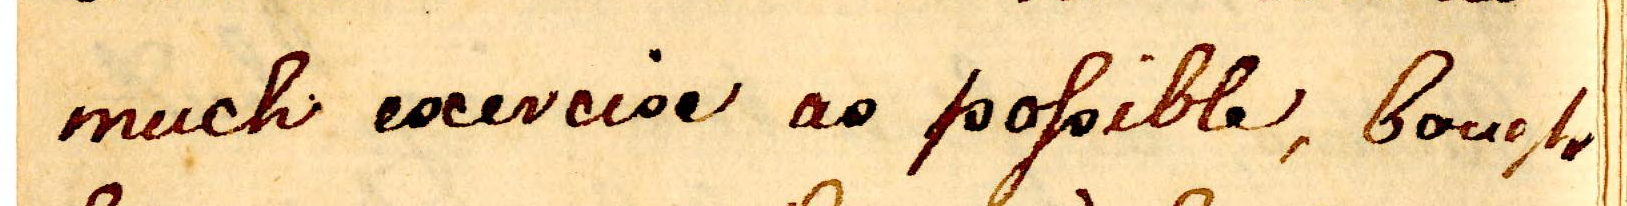much exercise as possible, bought
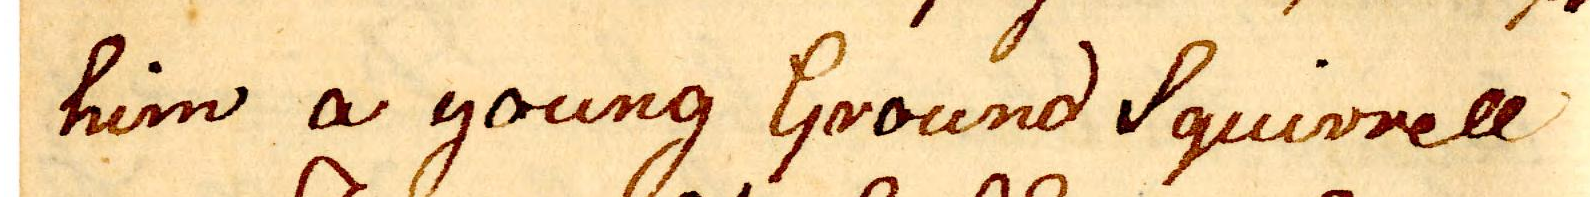him a young Ground Squirrell
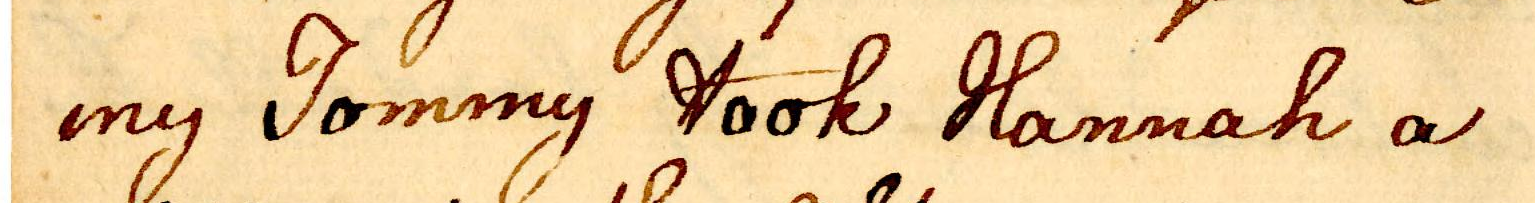my Tommy took Hannah a
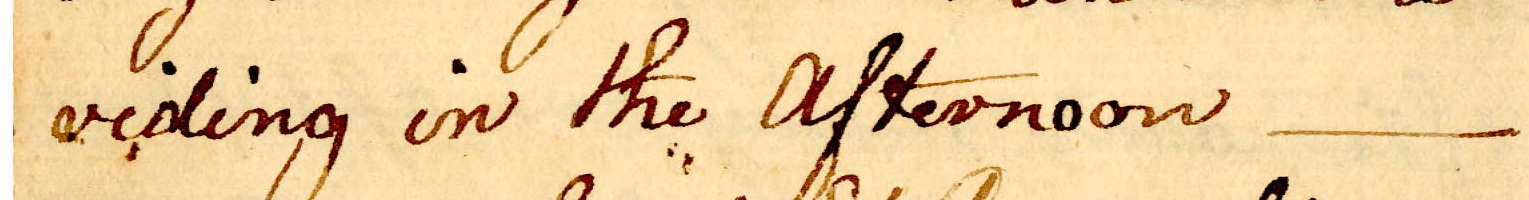riding in the Afternoon
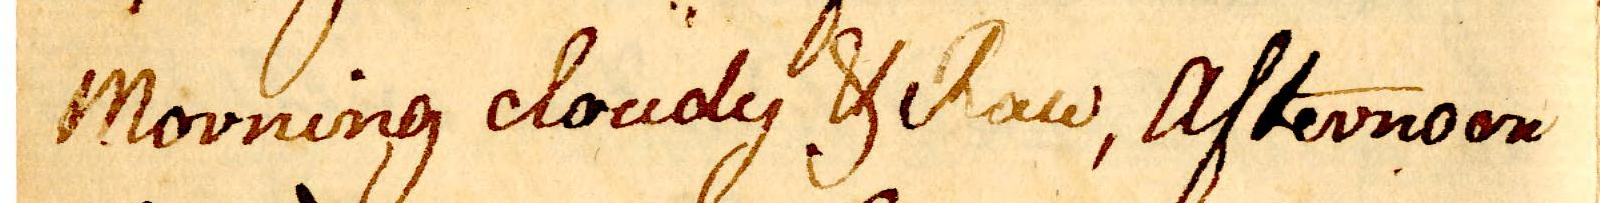Morning cloudy & Raw, Afternoon
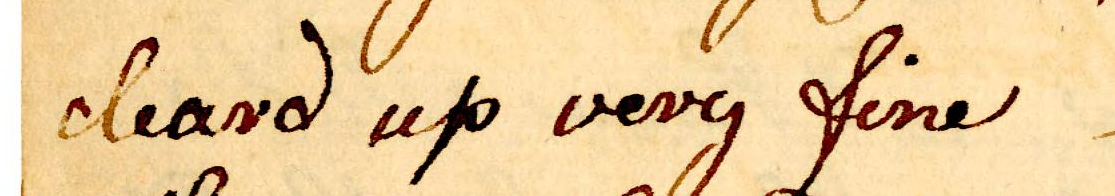cleard up very fine
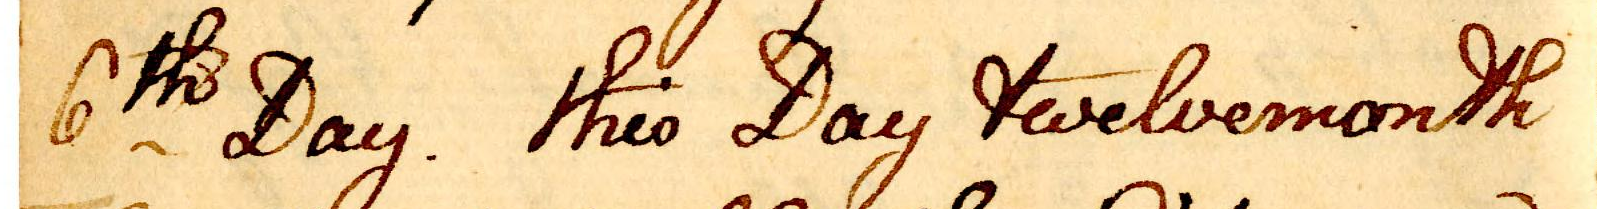6^th Day. this Day twelvemonth
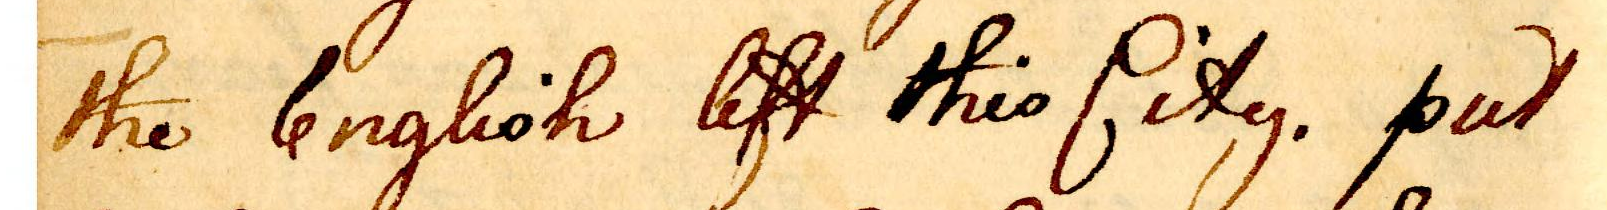the English left this City, put
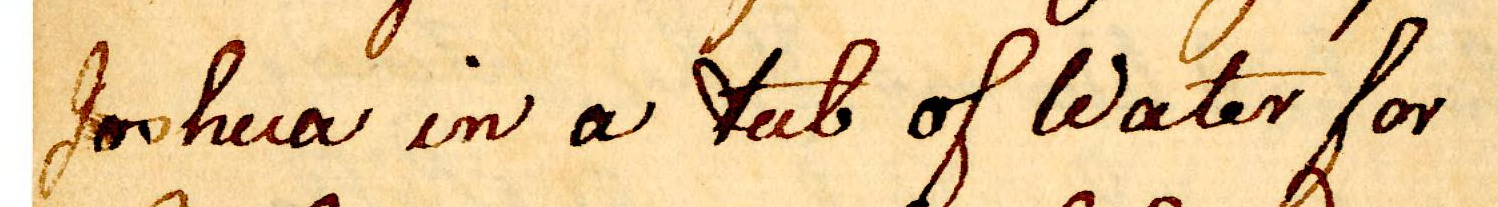Joshua in a tub of Water for
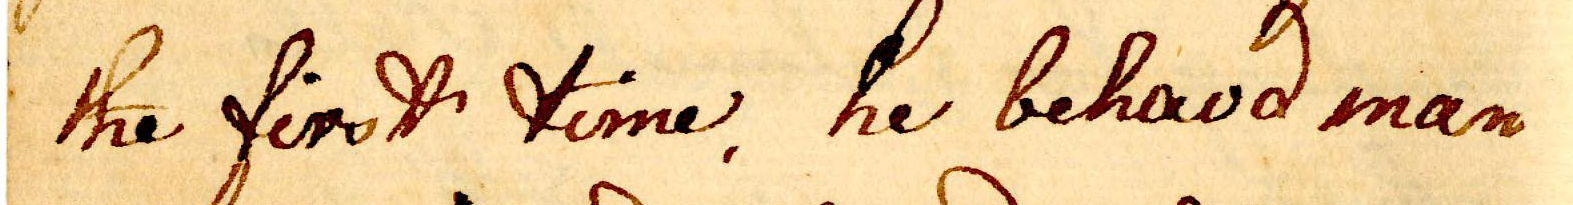the first time, he behavd man
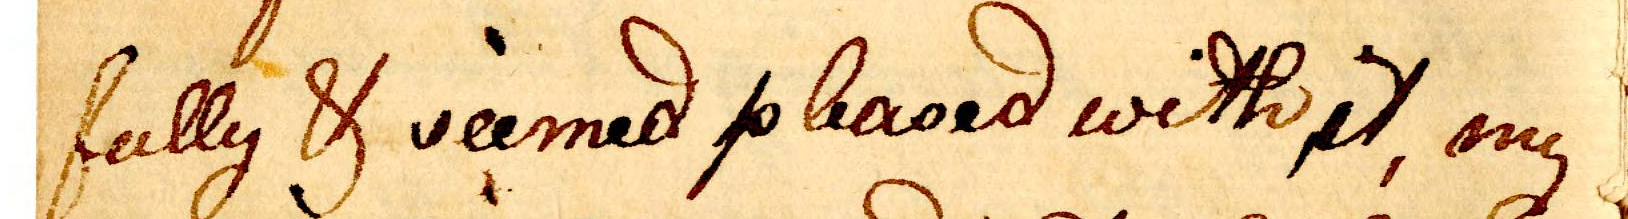fully & seemed pleased with it, my
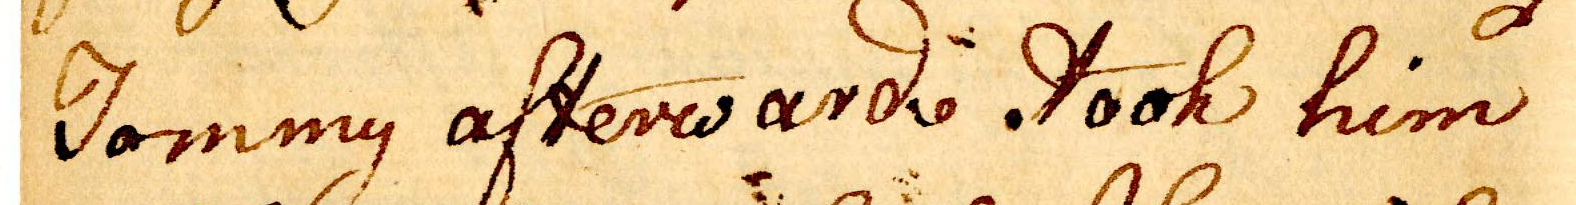Tommy afterwards took him
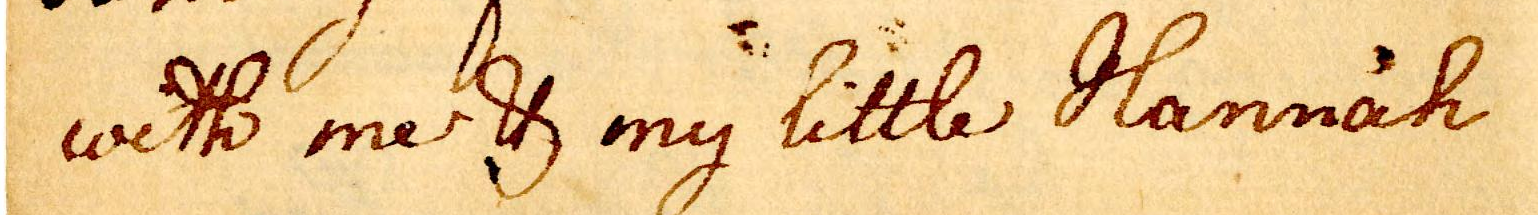with me & my little Hannah
